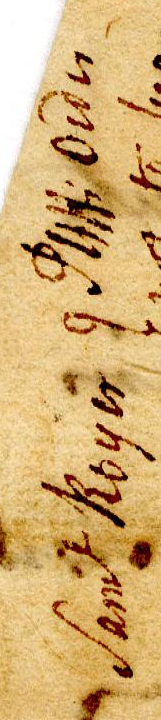Sam^l. Royer Pellll Order
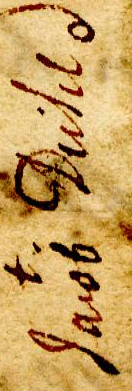Jacob Deisel
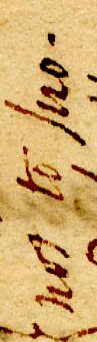not to pro-
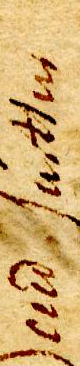-ceed further
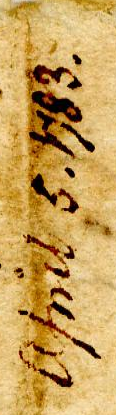April 5. 1783.
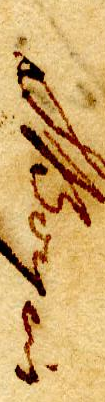S Boyer's
